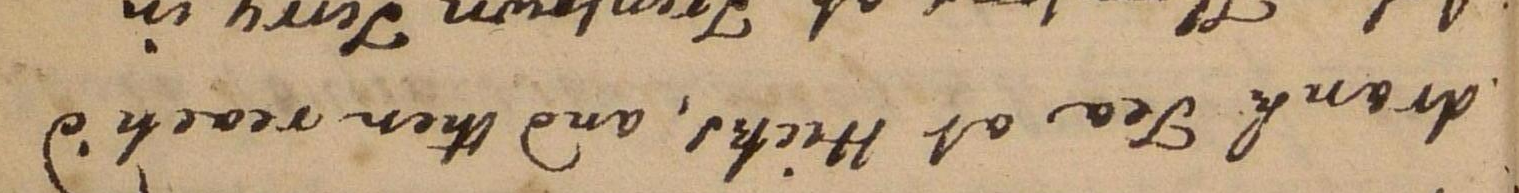drank Tea at Hicks, and then reach'd
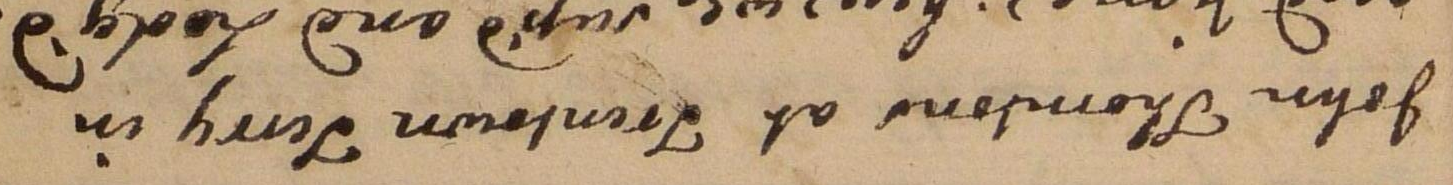John Thorntons at Trenton Ferry in
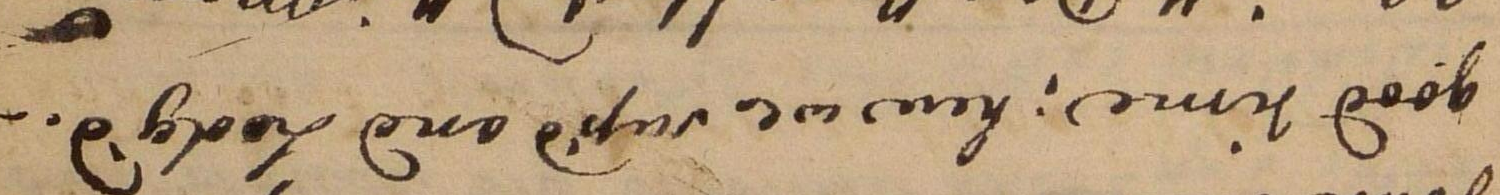good time; here we sup'd and Lodg'd. -
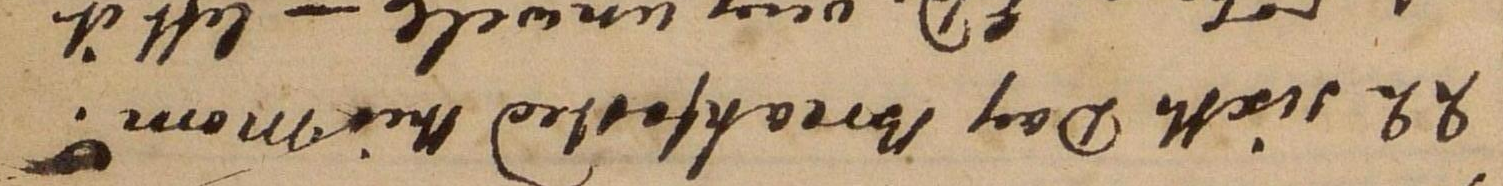22 sixth Day Breakfasted this Morn^g.
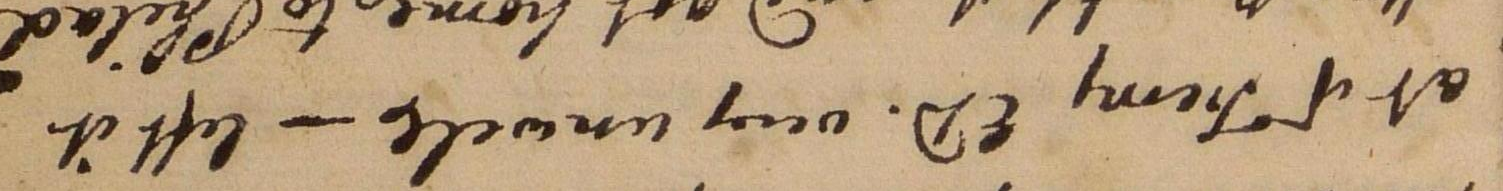at y^e Ferry ED. very unwell- left it
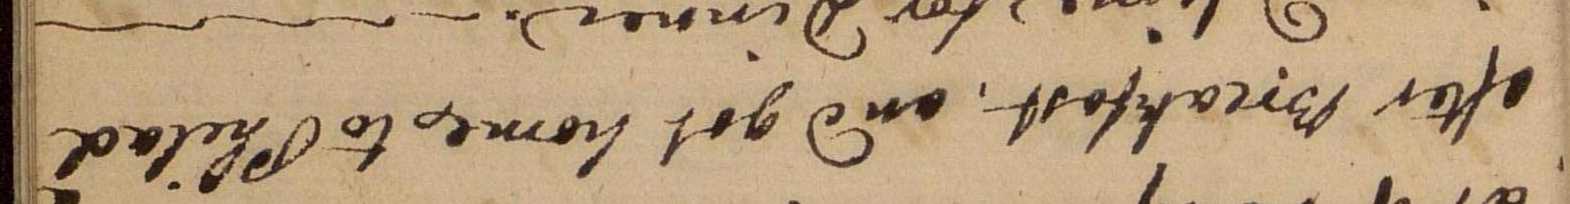after Breakfast, and got home to Philad^a
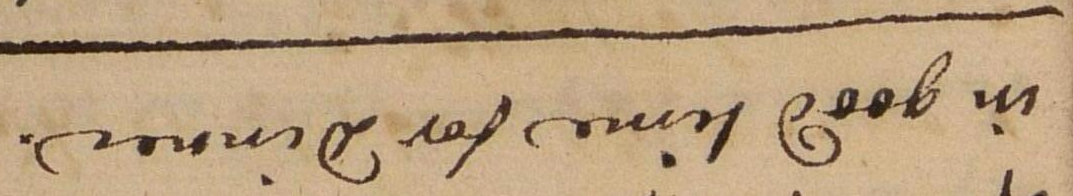in good time for Dinner. -
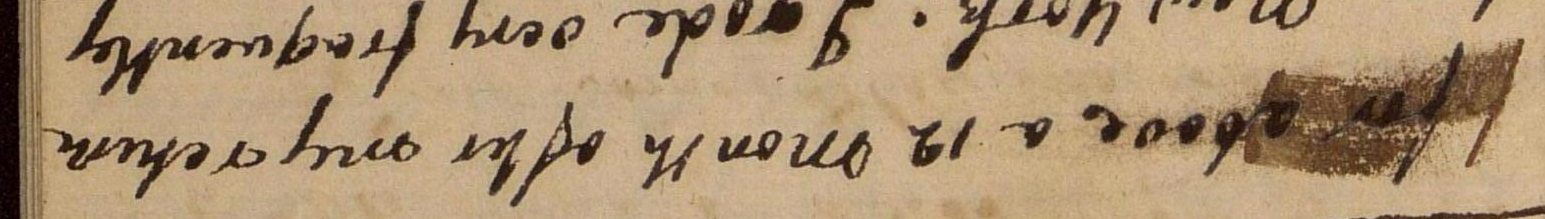for above a 12 Month after my return
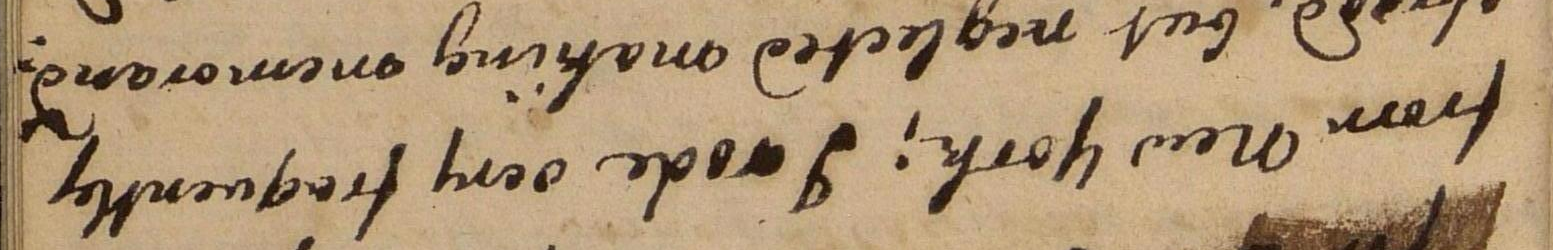from New York; I rode very frequently
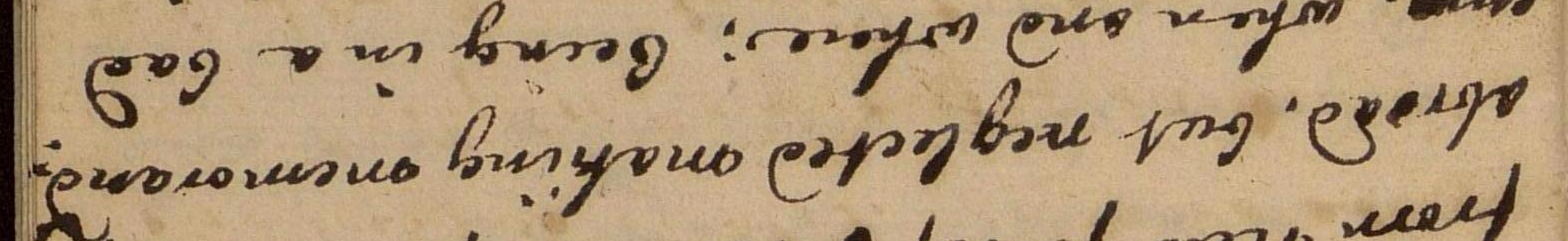abroad, but neglected making memorand-
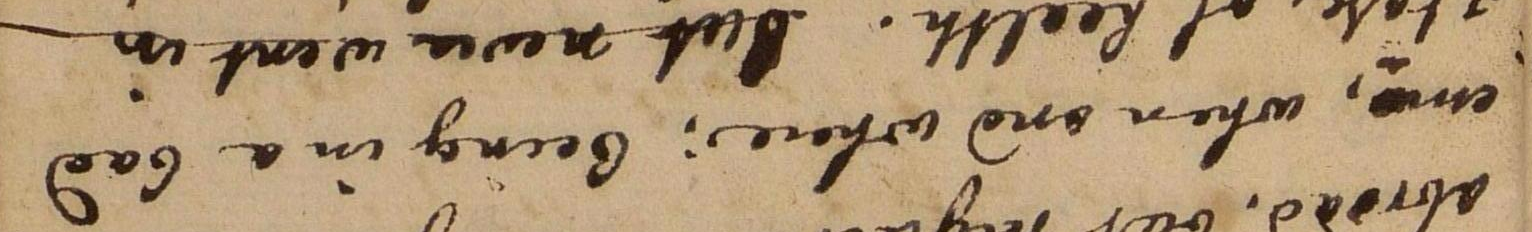em, when and where; being in a bad
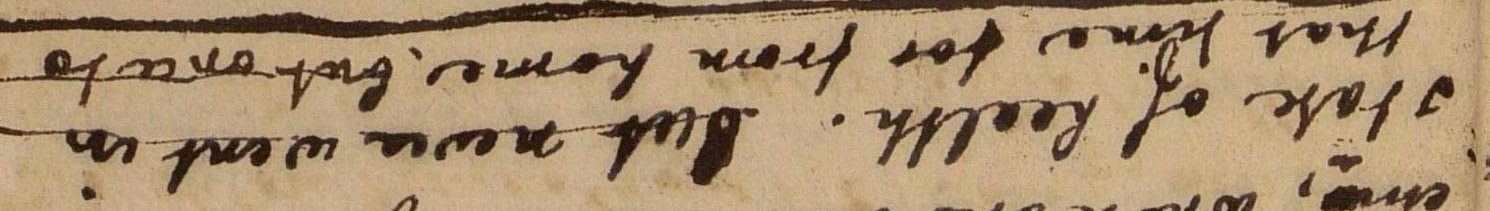state of health. but never went in
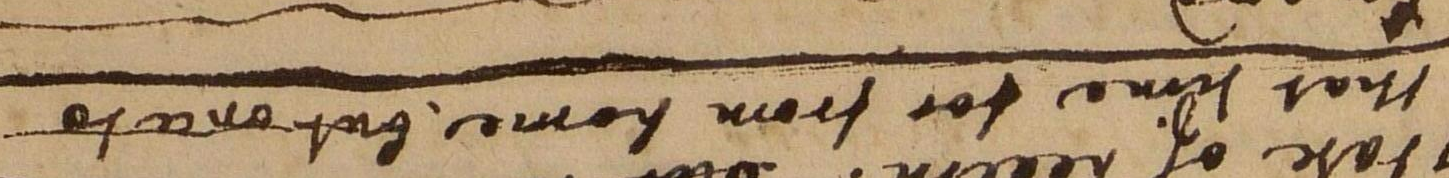that time far from home, but once to
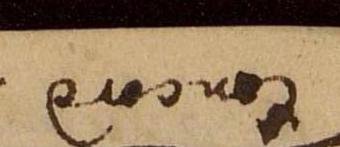Concord -
